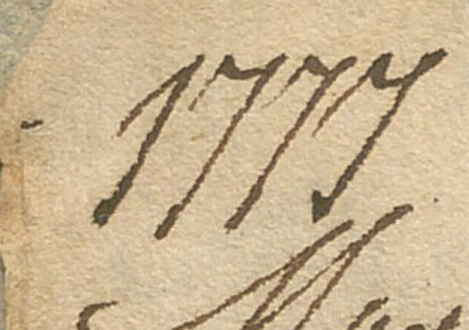1777
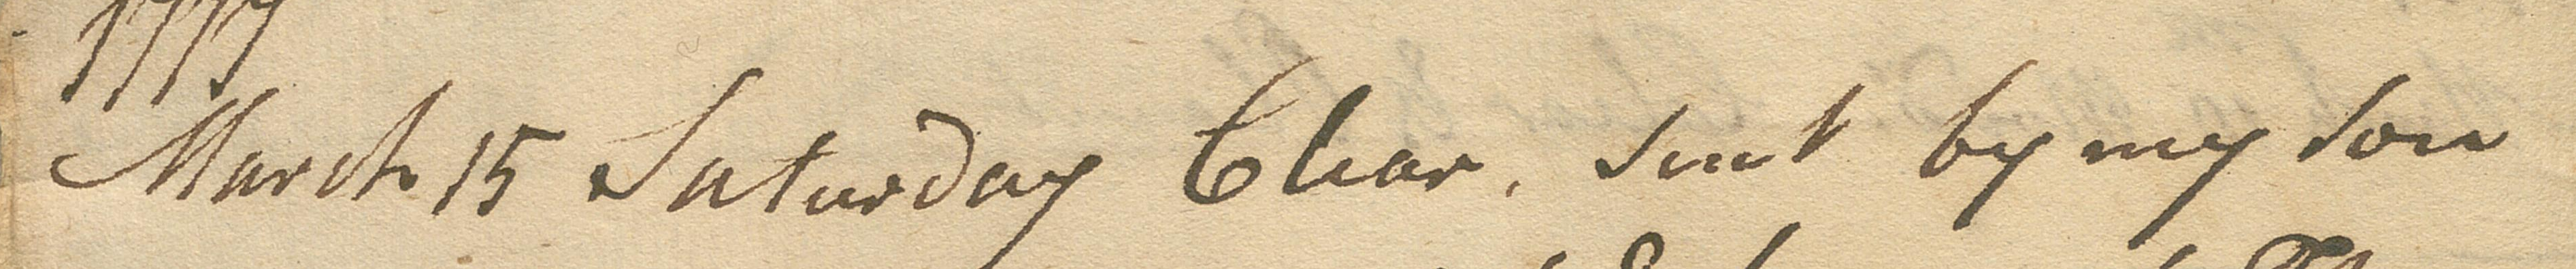March 15 Saturday Clear, sent by my son
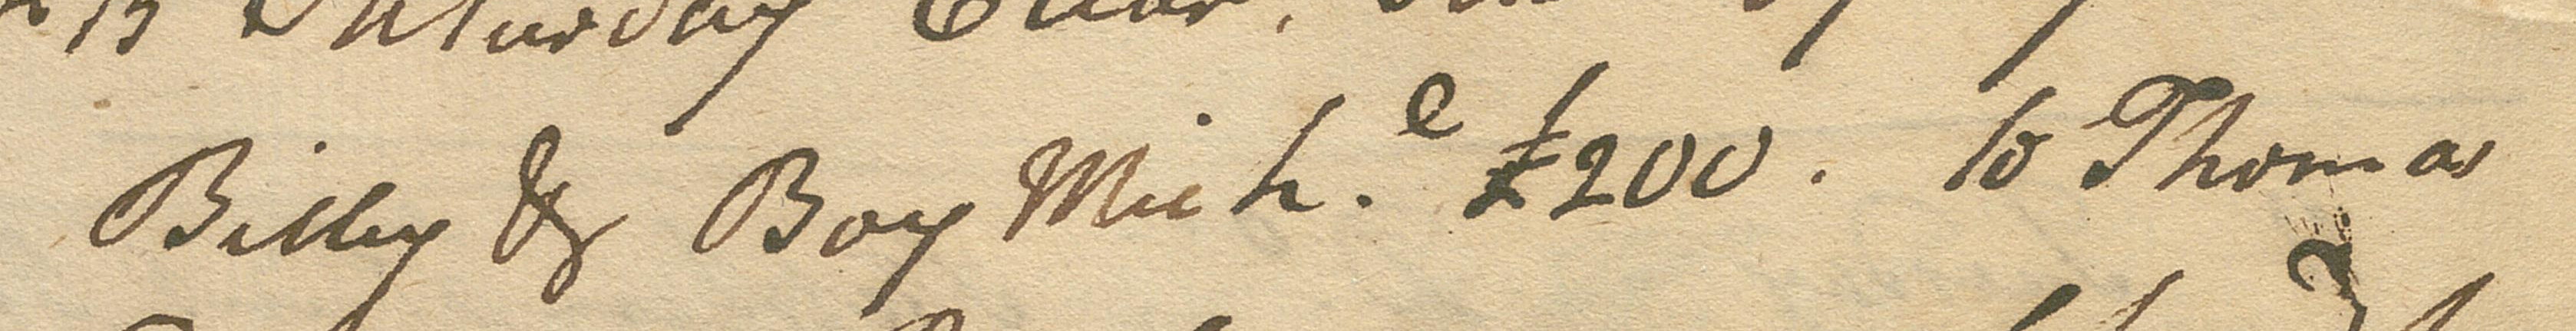Billey & Boy Mich^l. £200. to Thomas
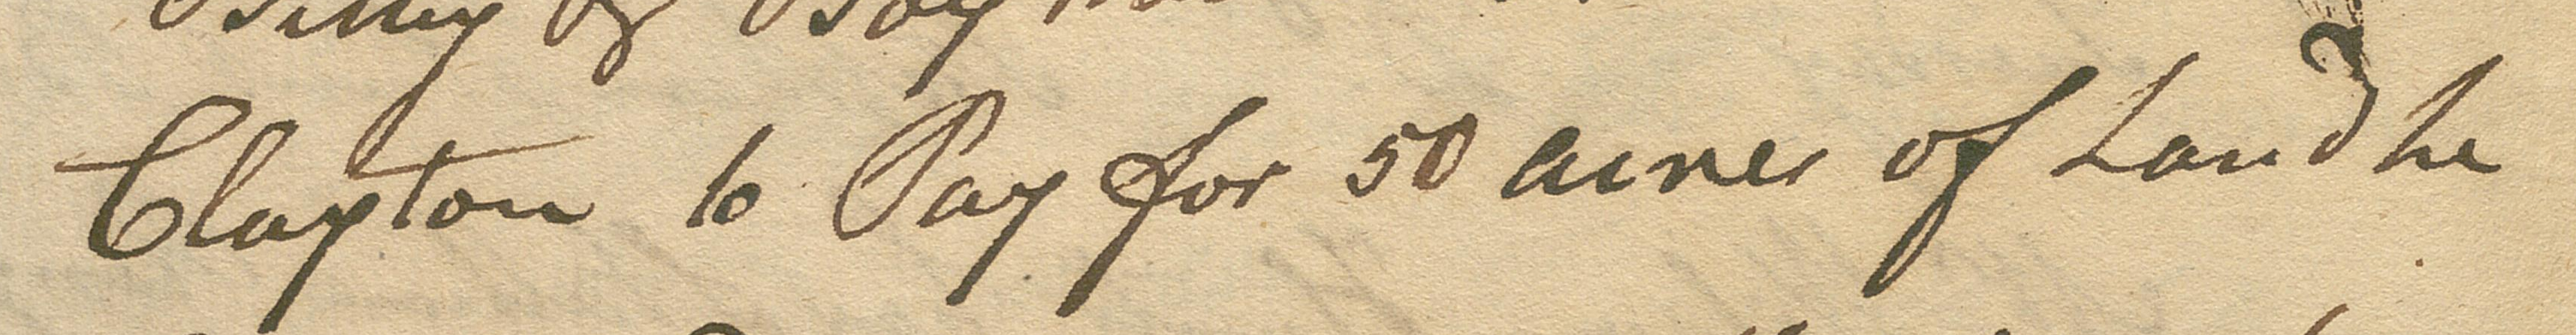Clayton to Pay for 50 acres of Land he
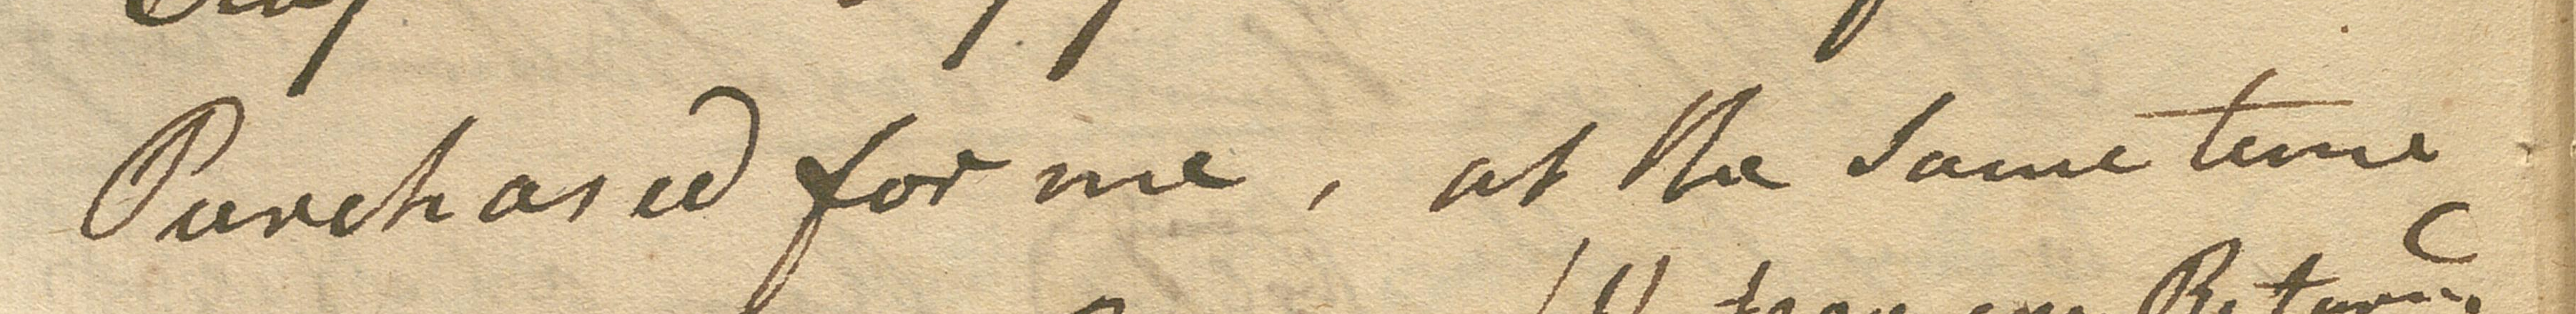Purchased for me, at the same time
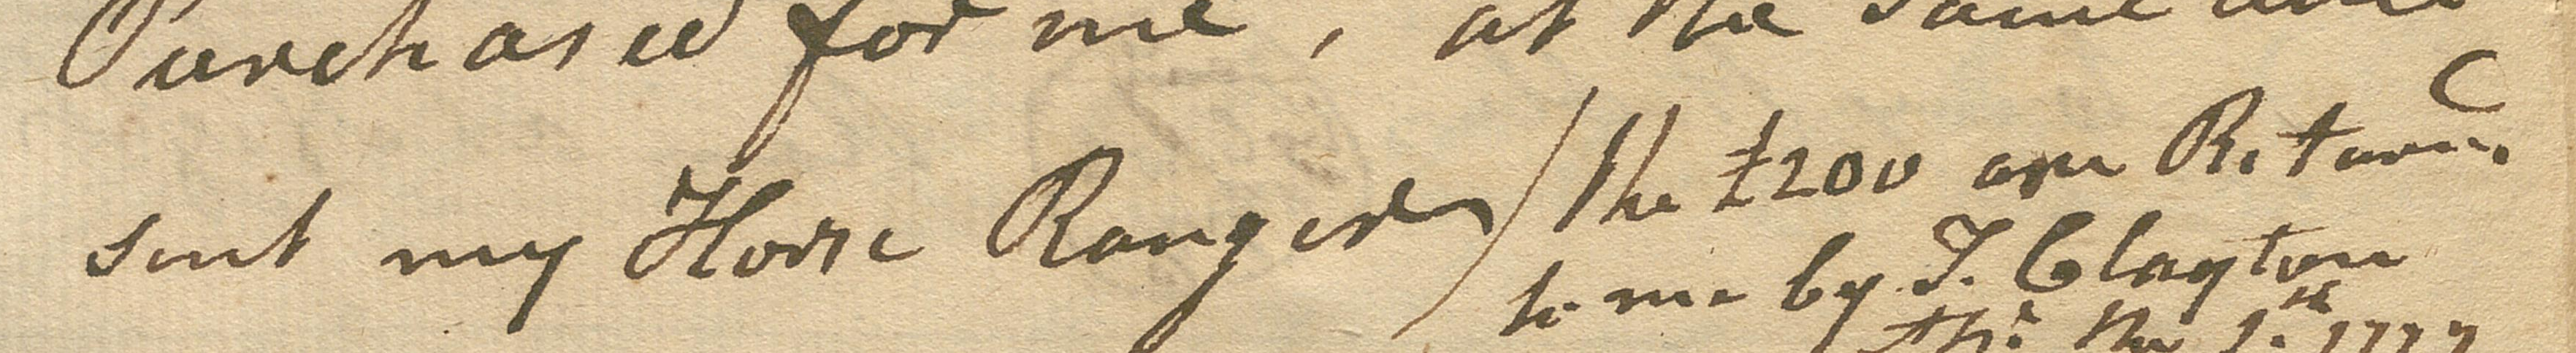sent my Horse Ranger / the £200 are Returnd
